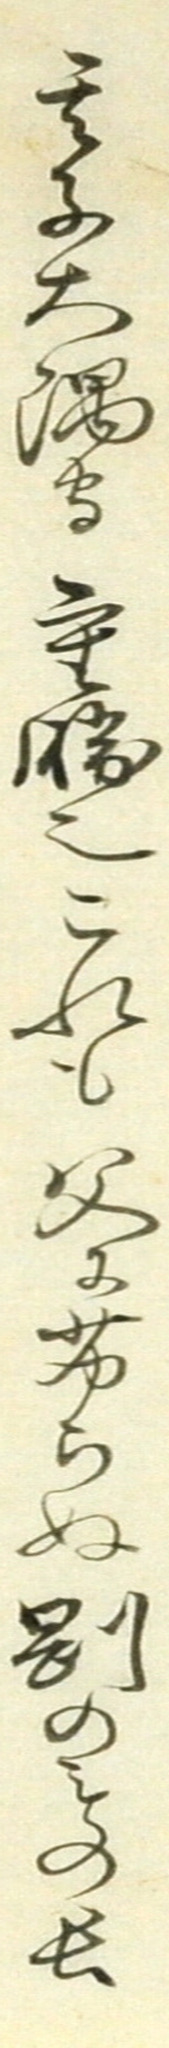其子大隅守重勝也これも父に劣らぬ剛のもの長
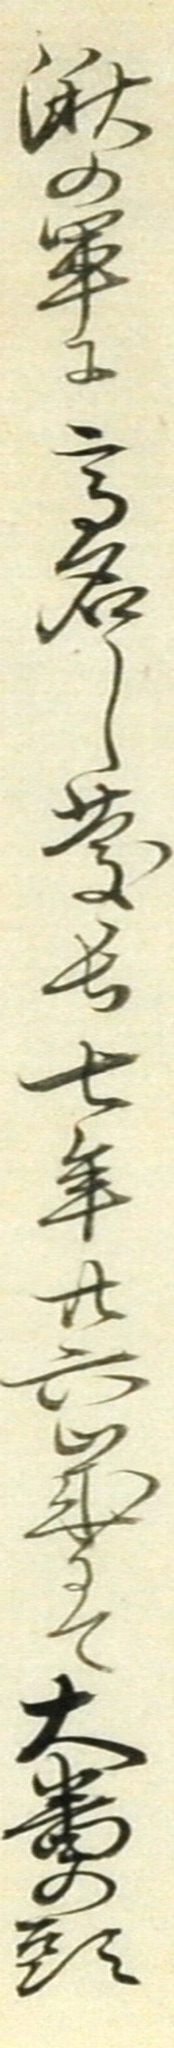湫の軍に高名し慶長七年廿六歳にて大番の頭
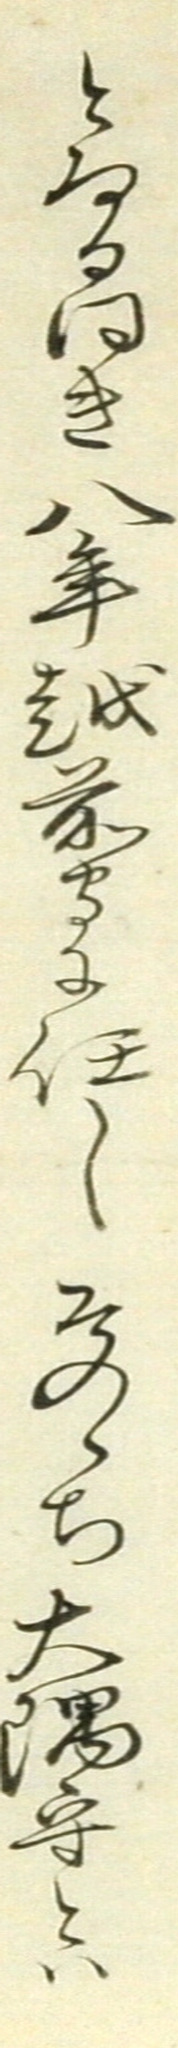となる同き八年越前守に任しそのゝち大隅とは
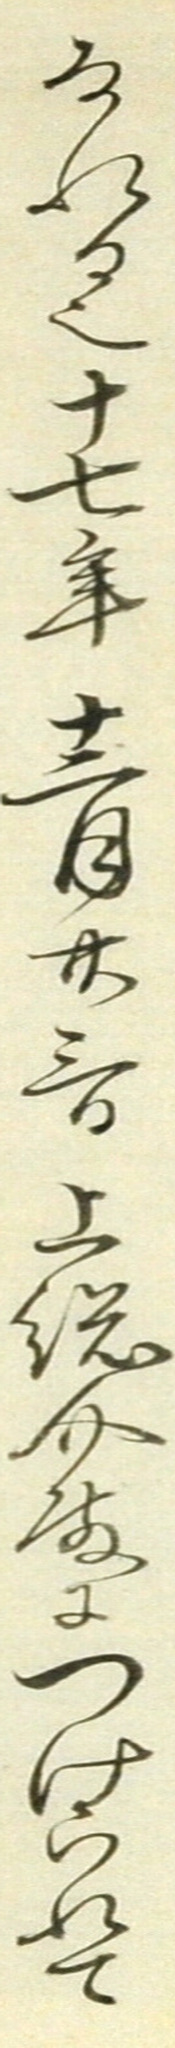なれる也十七年十二月廿三日上総介殿につけられて
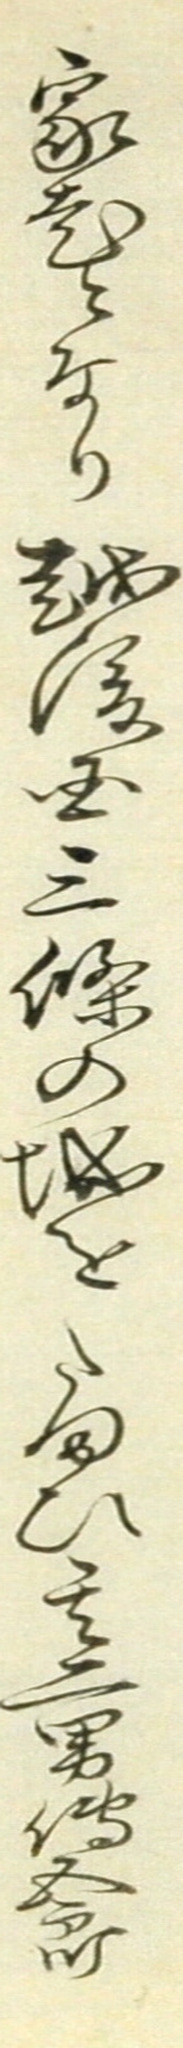家老となり越後国三条の城をたまひ其二男伝五郎
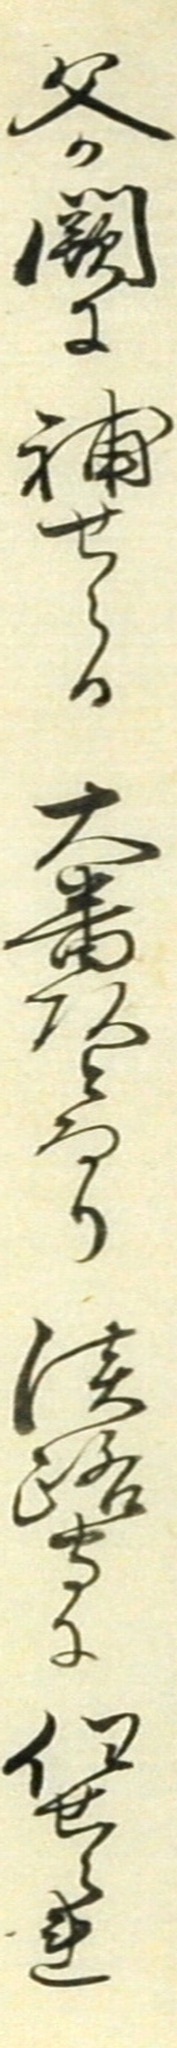父か闕に補せらる大番頭となり淡路守に任せられ
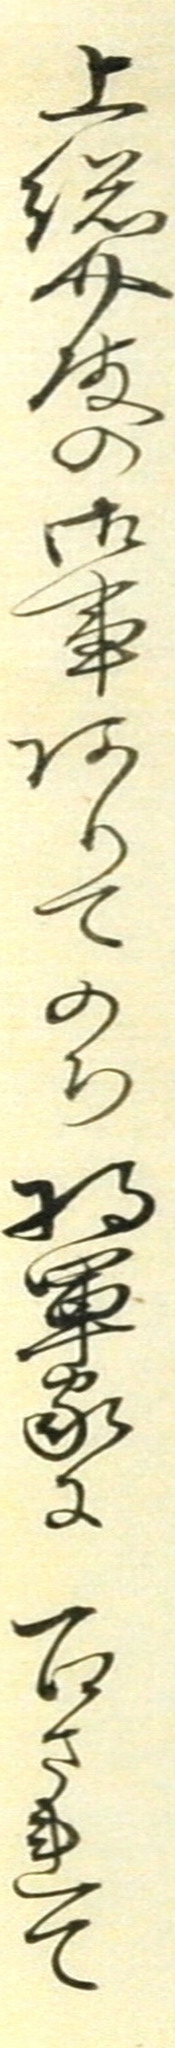上総介殿の御事ありてのち将軍家に召されて

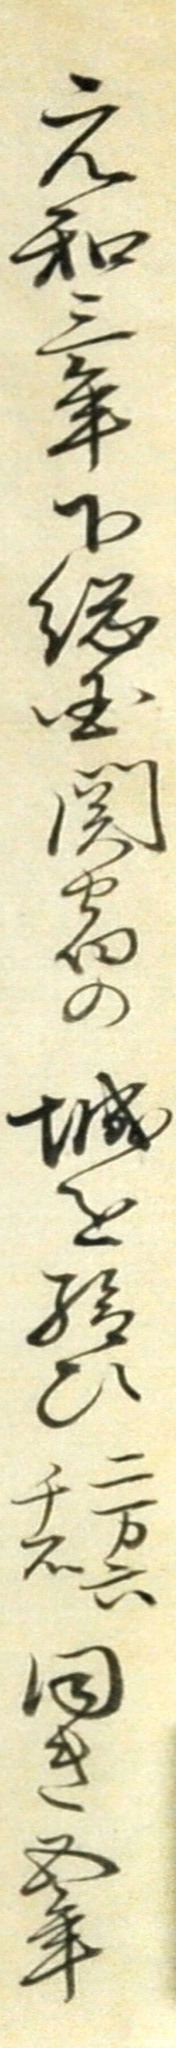元和三年下総国関宿の城を給ひ二万六千石同き五年
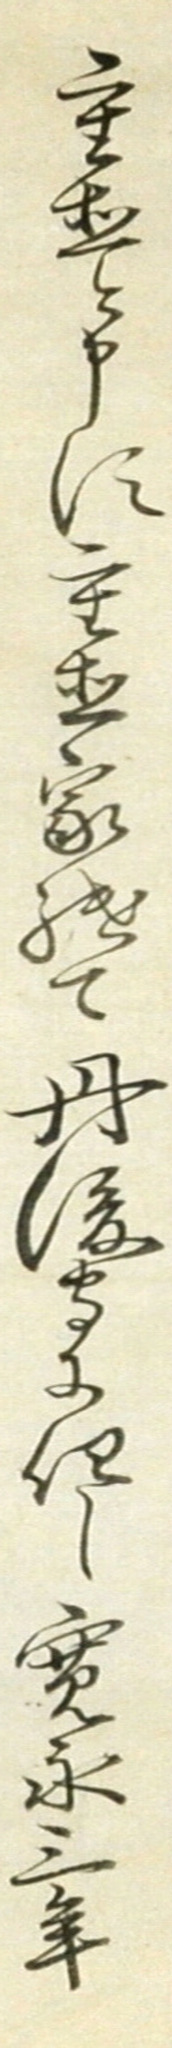重直と申す重直家継て丹後守に任し寛永三年
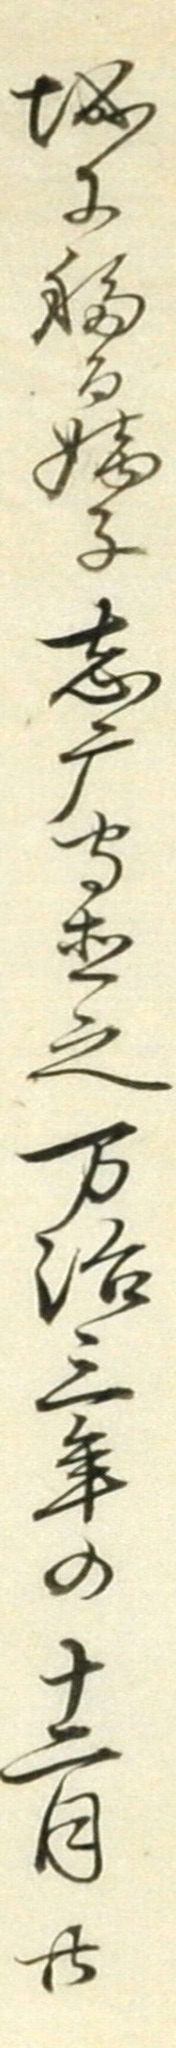城に移る嫡子志摩守直之万治三年の十二月廿
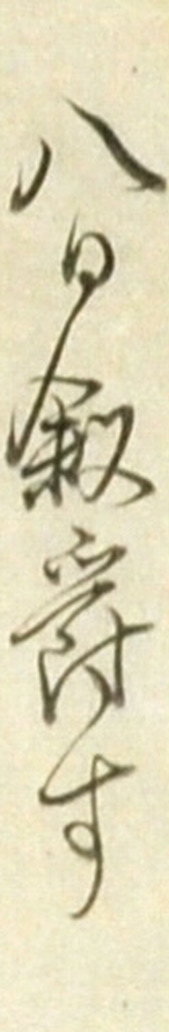八日叙爵す
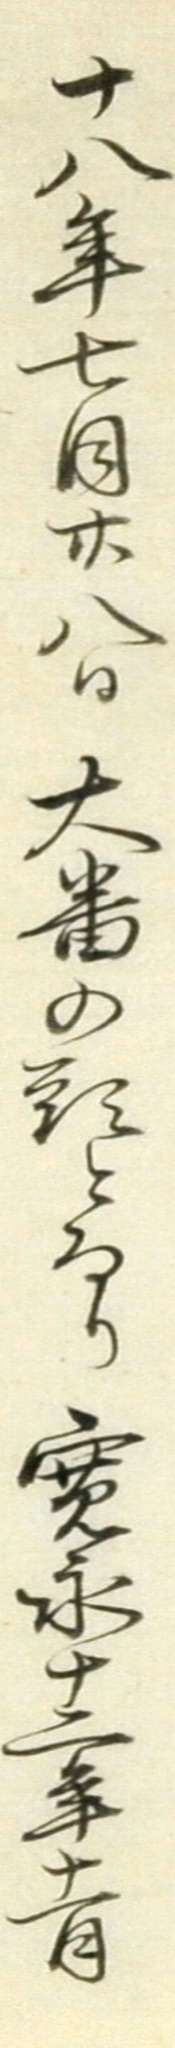十八年七月廿八日大番の頭となり寛永十二年十一月
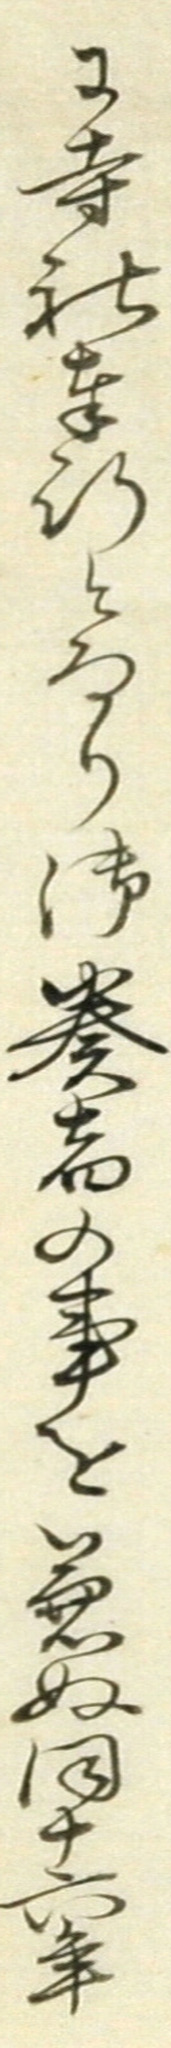に寺社奉行となり御奏者の事を兼ぬ同十六年
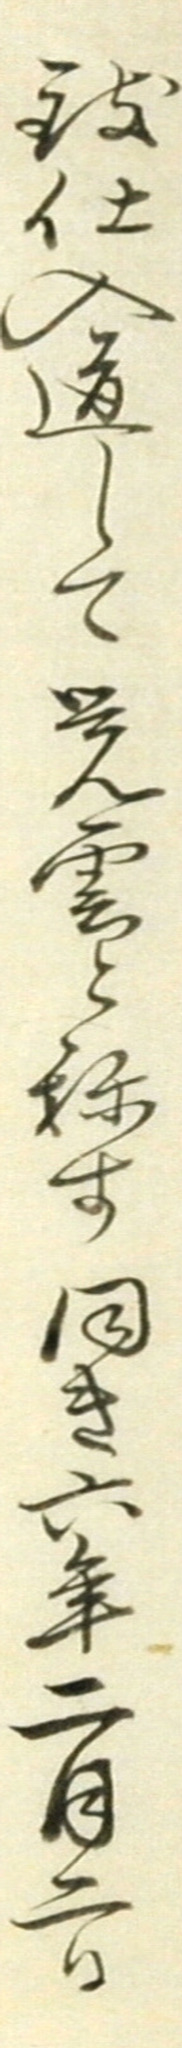致仕入道して覚雲と称す同き六年二月二日
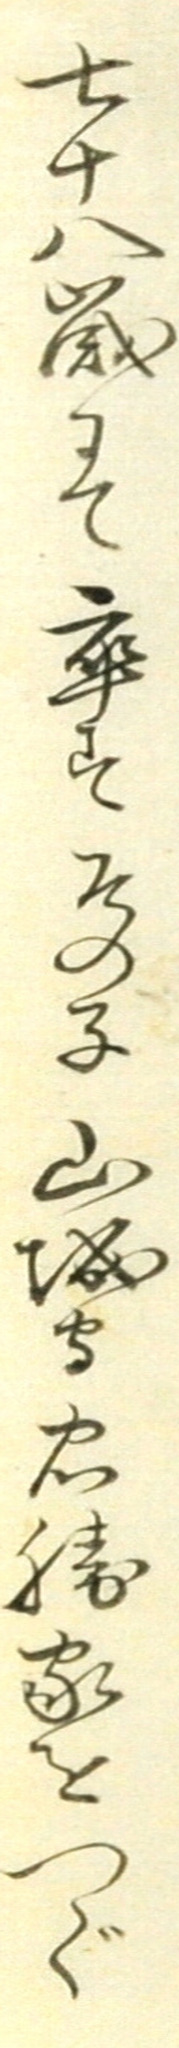七十八歳にて卒すその子山城守忠勝家をつぐ

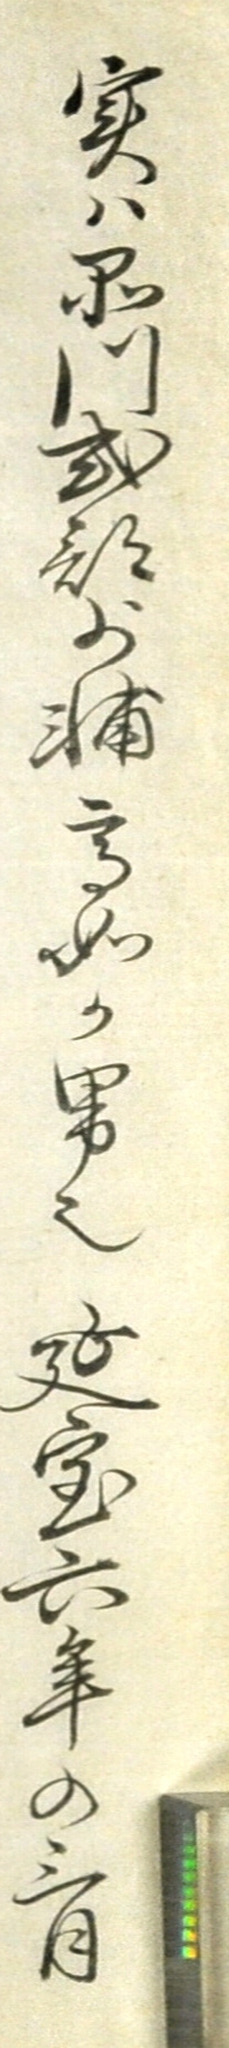実は品川式部少輔高如か男也延宝六年の三月
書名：藩翰譜（二・三）
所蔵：伊那市立高遠町図書館・合同会社AMANE
